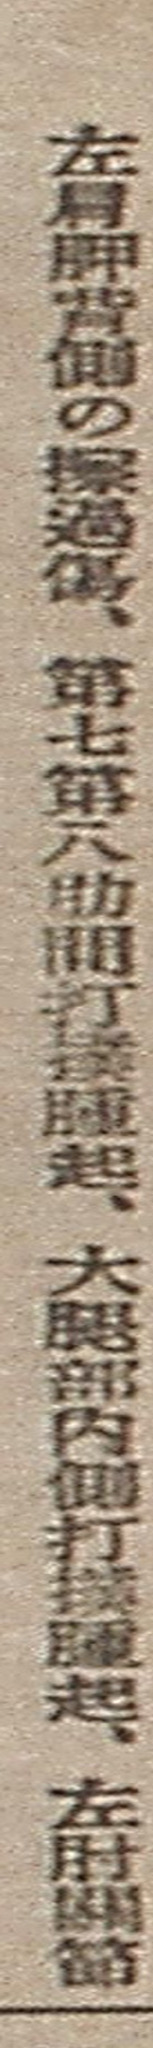左肩胛背側の擦過傷、第七第八肋間打撲腫起、大腿部内側打撲腫起、左肘関節
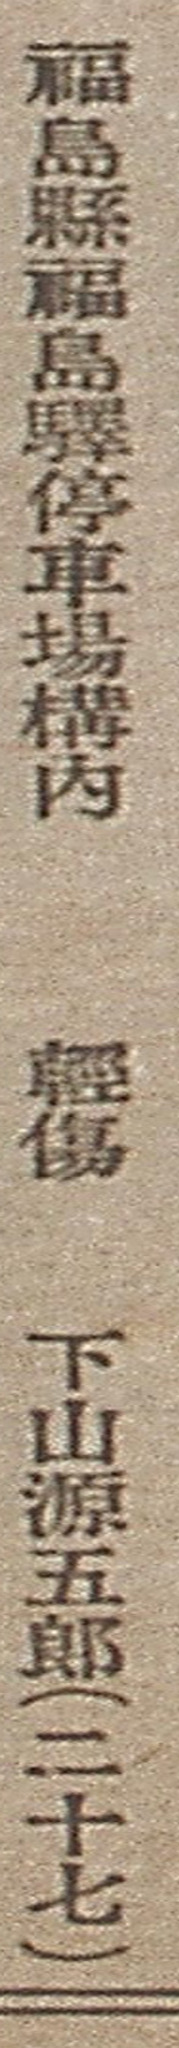福島県福島駅停車場構内軽傷下山源五郎
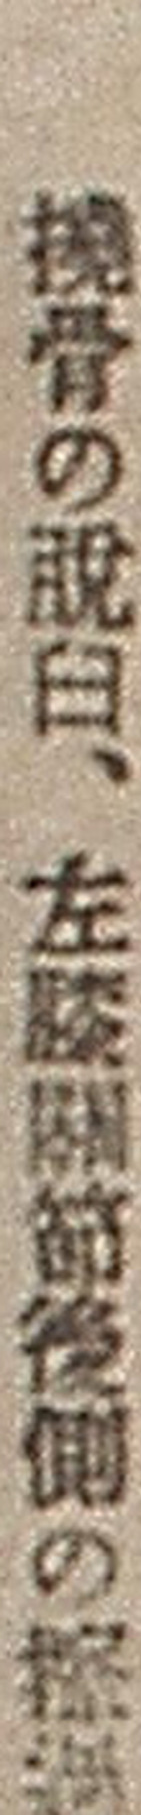撓骨の脱臼、左膝関節後側の擦過傷
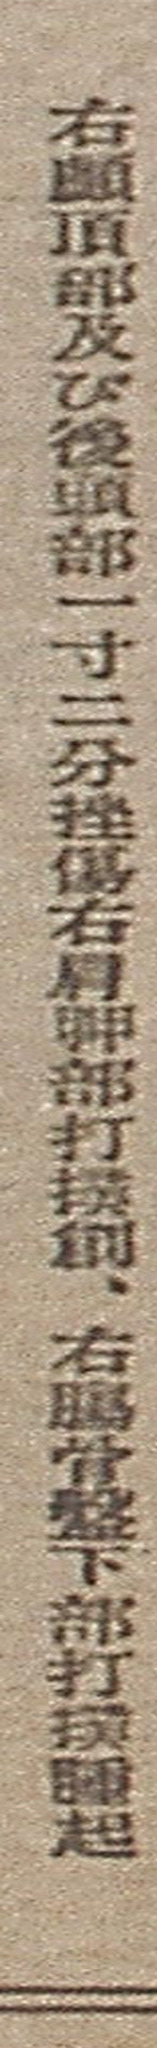右頗頂部及び後頭部一寸二分挫傷右肩胛部打撲創、右腹骨盤下部打撲腫起
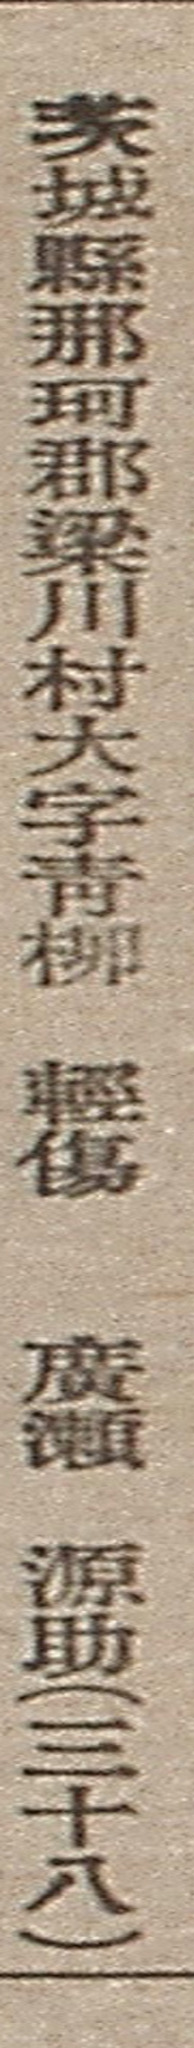茨城県那珂郡梁川村大字青柳軽傷広瀬源助
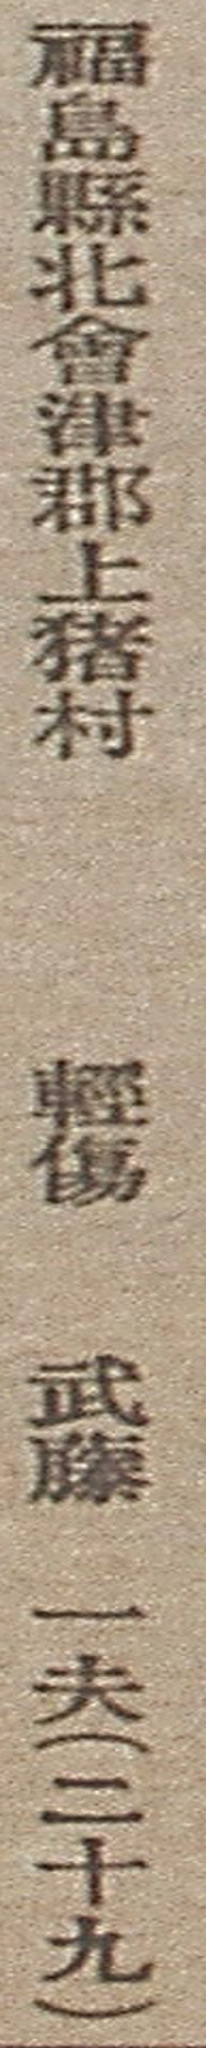福島県北会津郡上猪村軽傷武藤一夫
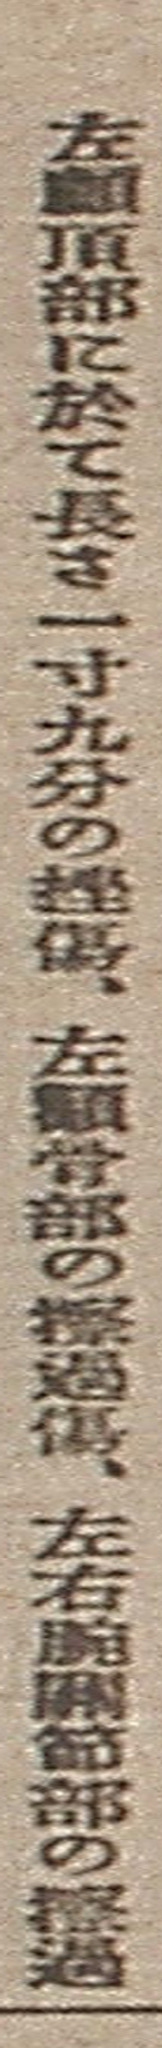左頗頂部に於て長さ一寸九分の挫傷、左額骨部の擦過傷、左右腕関節部の擦過
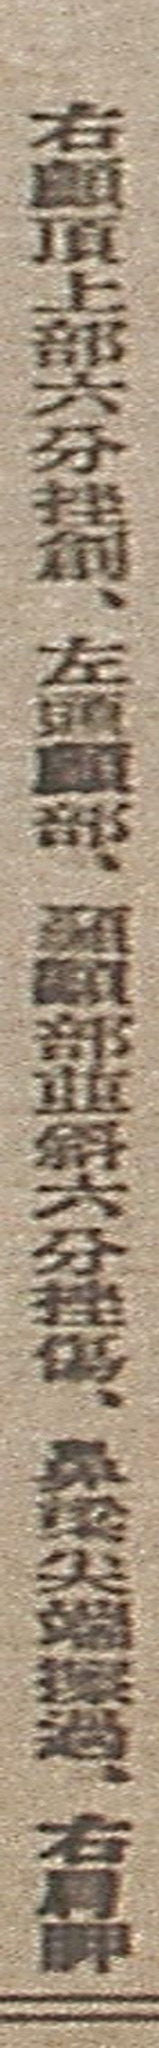右頗頂上部六分挫創、左頭頗部、顔頗部並斜六分挫傷、鼻梁尖端擦過、右肩胛
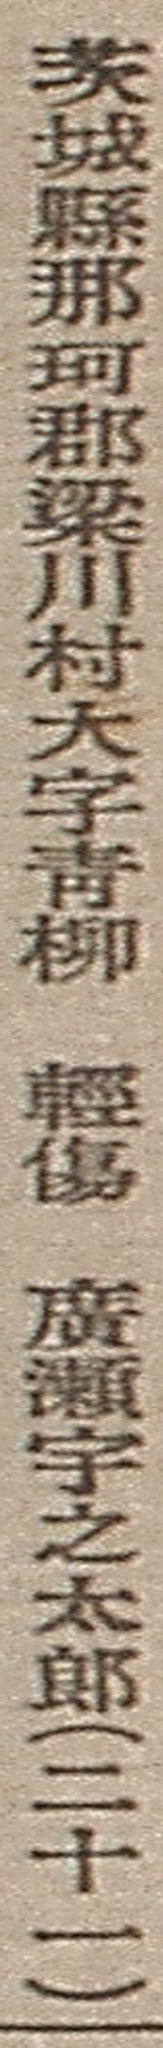茨城県那珂郡梁川村大字青柳軽傷広瀬宇之太郎
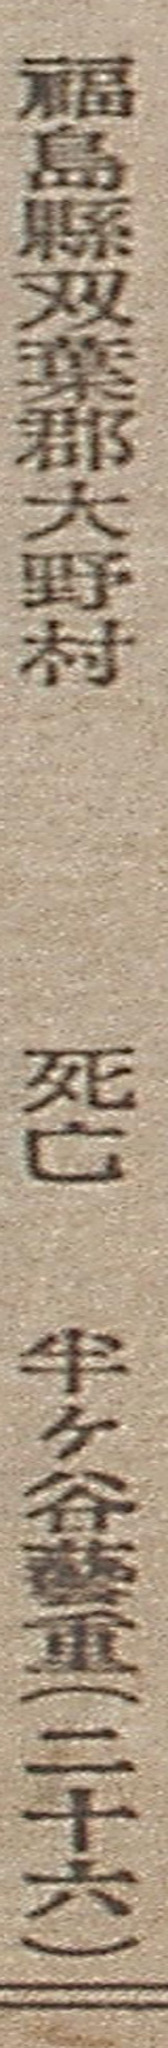福島県双葉郡大野村死亡半ケ谷芸重
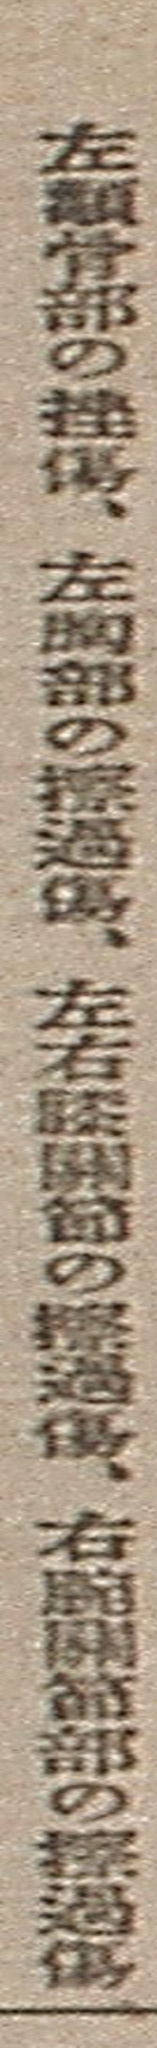左額骨部の挫傷、左胸部の擦過傷、左右膝関節の擦過傷、右腕関節部の擦過傷
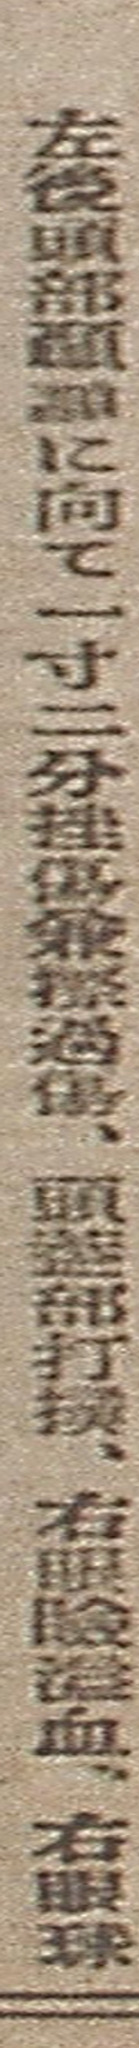左後頭部顔額に向て一寸二分挫傷兼擦過傷、頭蓋部打撲、右眼瞼溢血、右眼球
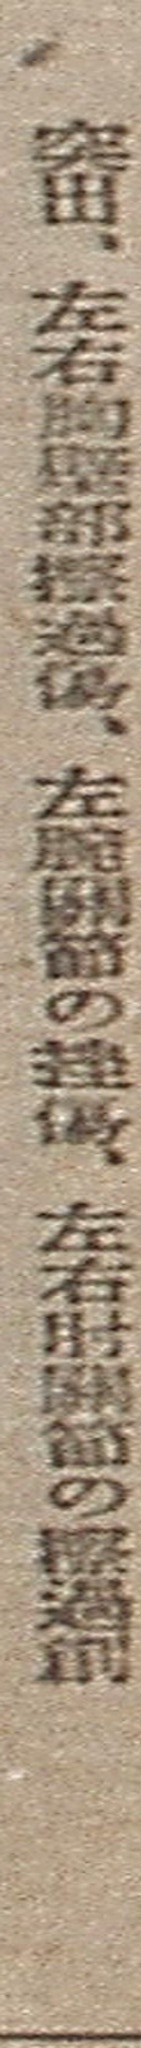突出、左右胸壁部擦過傷、左腕関節の挫傷、左右肘関節の擦過創
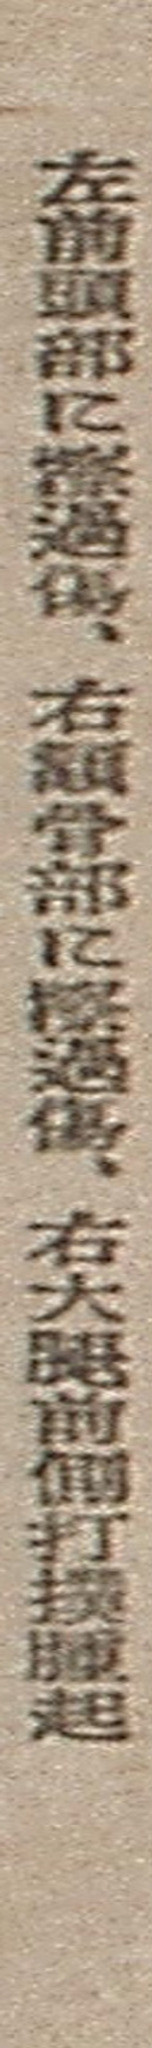左前頭部に擦過傷、右額骨部に擦過傷、右大腿前側打撲腫起
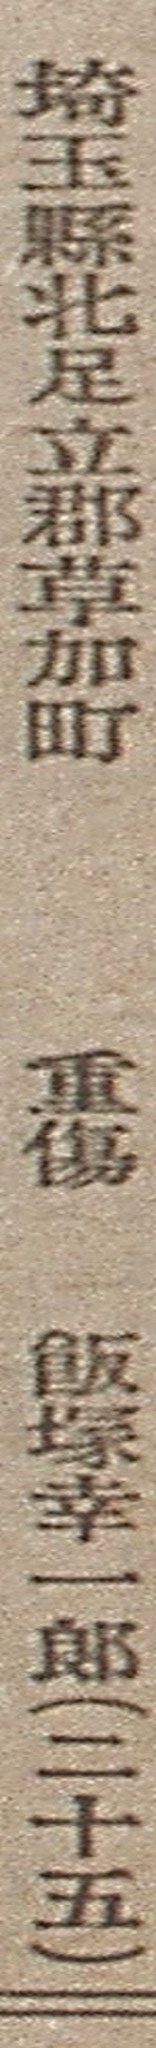埼玉県北足立郡草加町重傷飯塚幸一郎
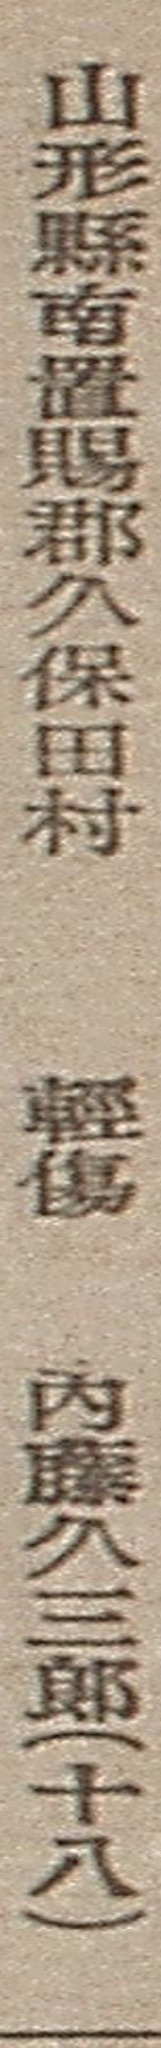山形県南置賜郡久保田村軽傷内藤久三郎
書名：風俗畫報臨時増刊第百九十九號　明治三十二年十月各地災害圖會（前編之續）
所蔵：東京大学地震研究所図書室 Earthquake Research Institute Library, The University of Tokyo, JAPAN
